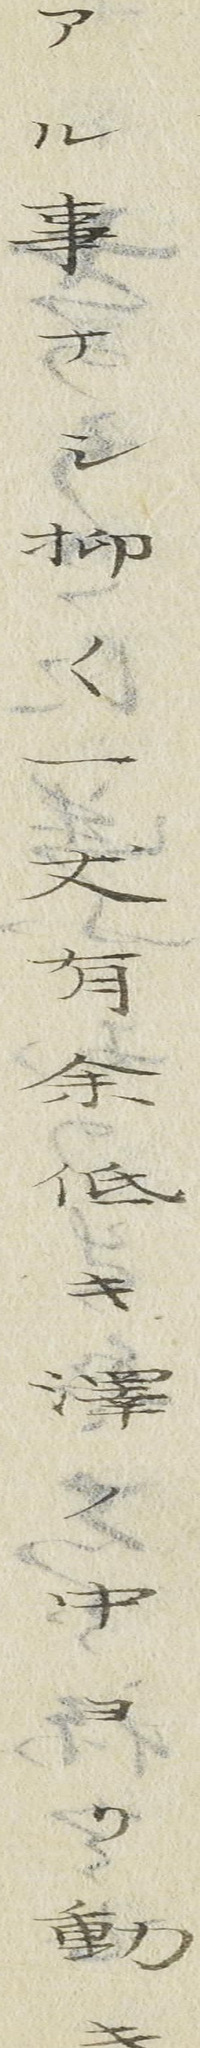アル事ナシ抑〱一丈有余低キ沢ノ中ヨリ動キ
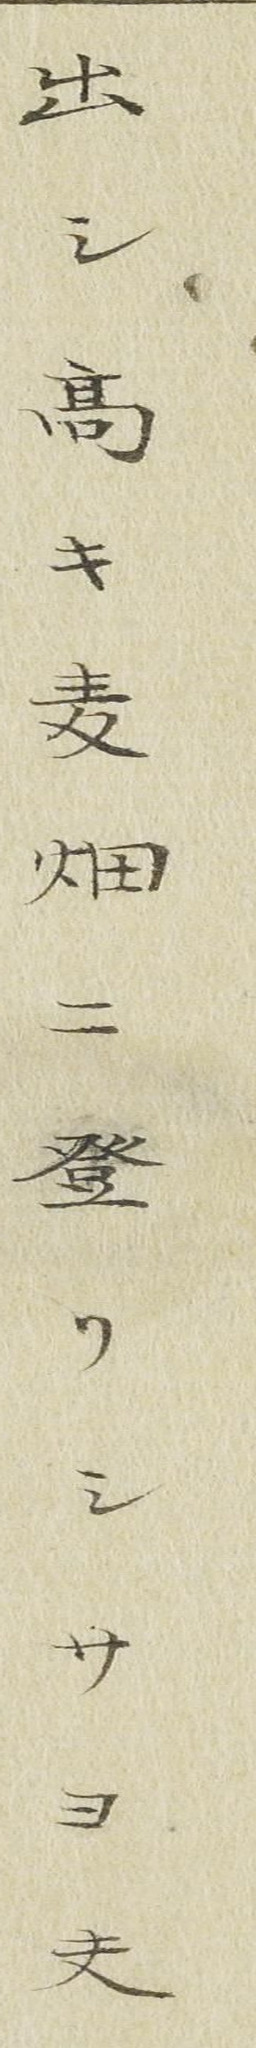出シ高キ麦畑ニ登リシサヨ夫
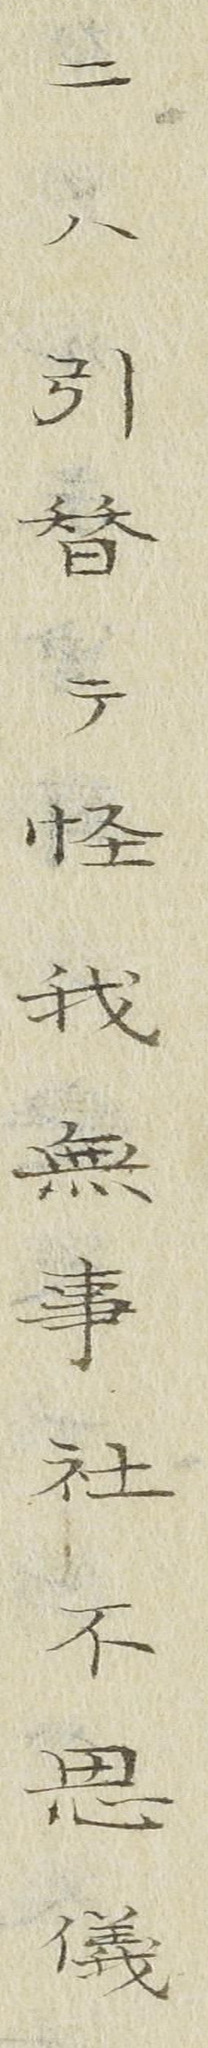ニハ引替テ怪我無事社不思儀
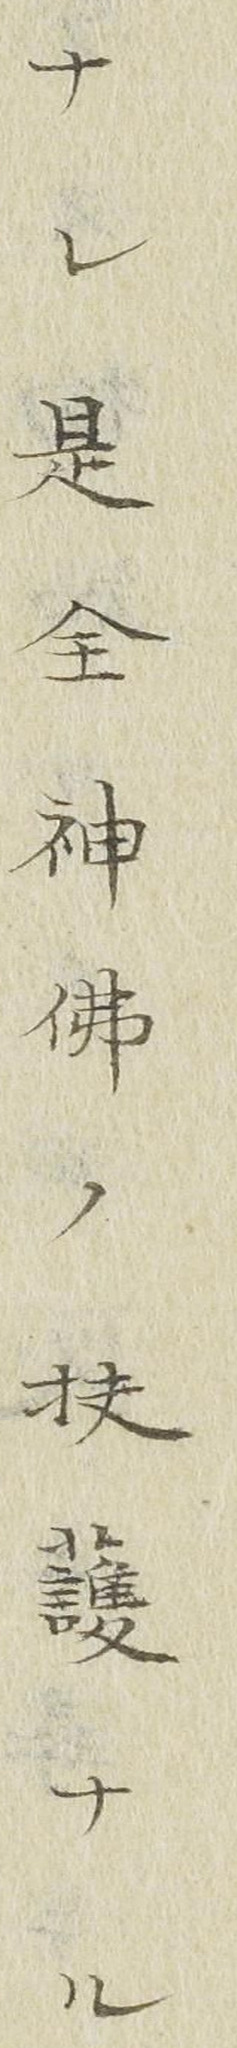ナレ是全神仏ノ扶護ナル
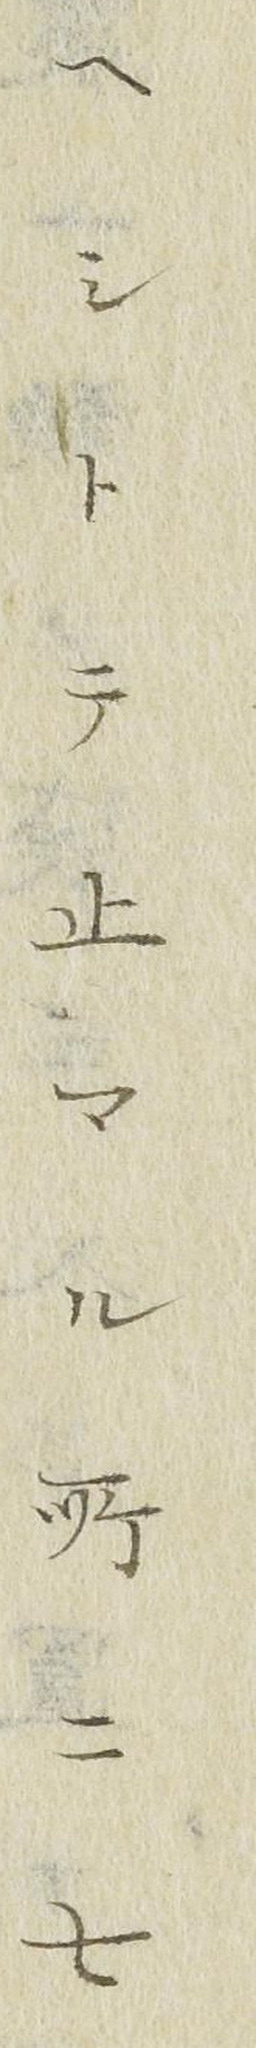ヘシトテ止マル所ニ七
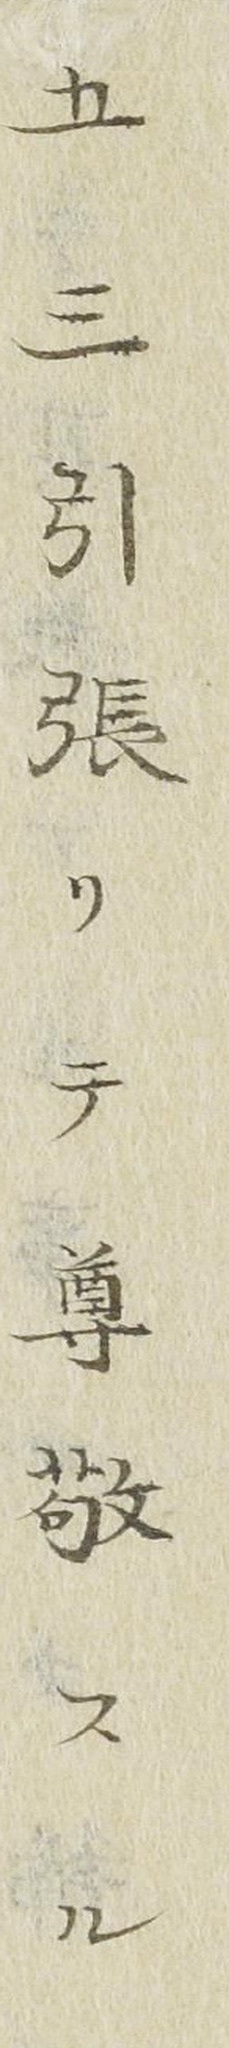五三引張リテ尊敬スル
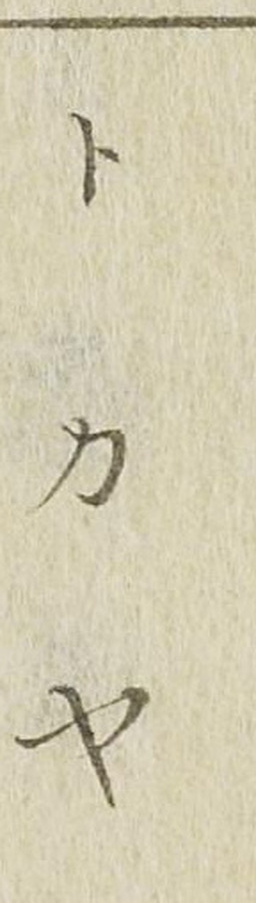トカヤ
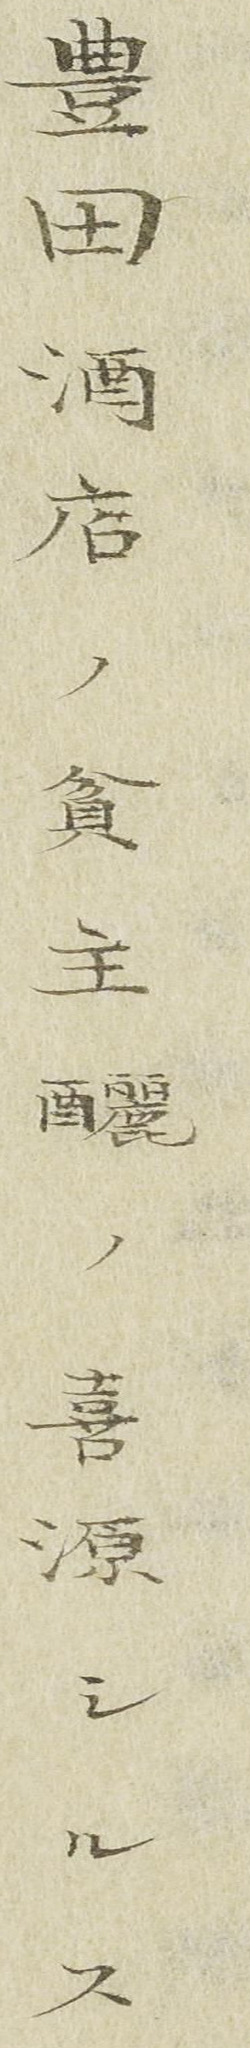豊田酒店ノ貧主釃ノ喜源シルス

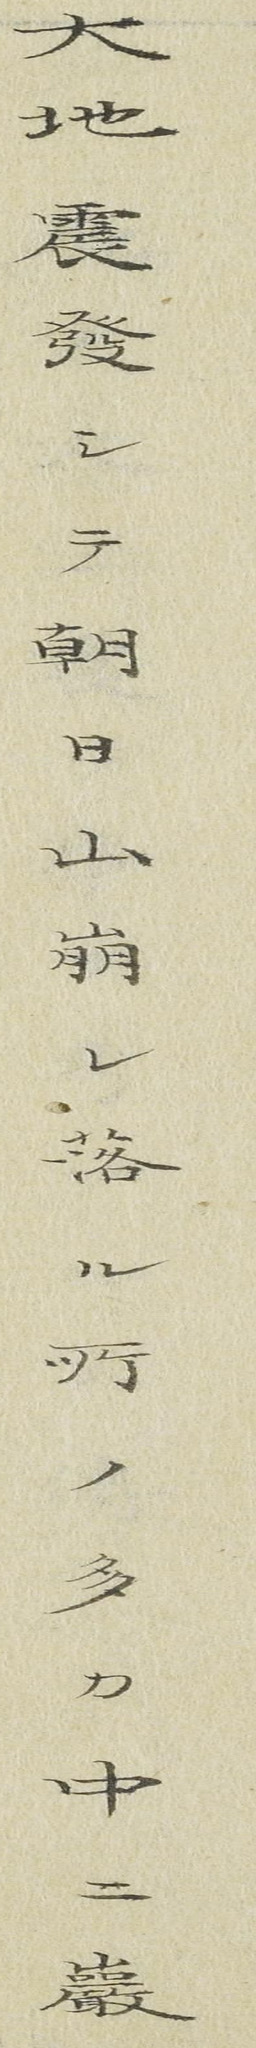大地震発シテ朝日山崩レ落ル所ノ多カ中ニ巌
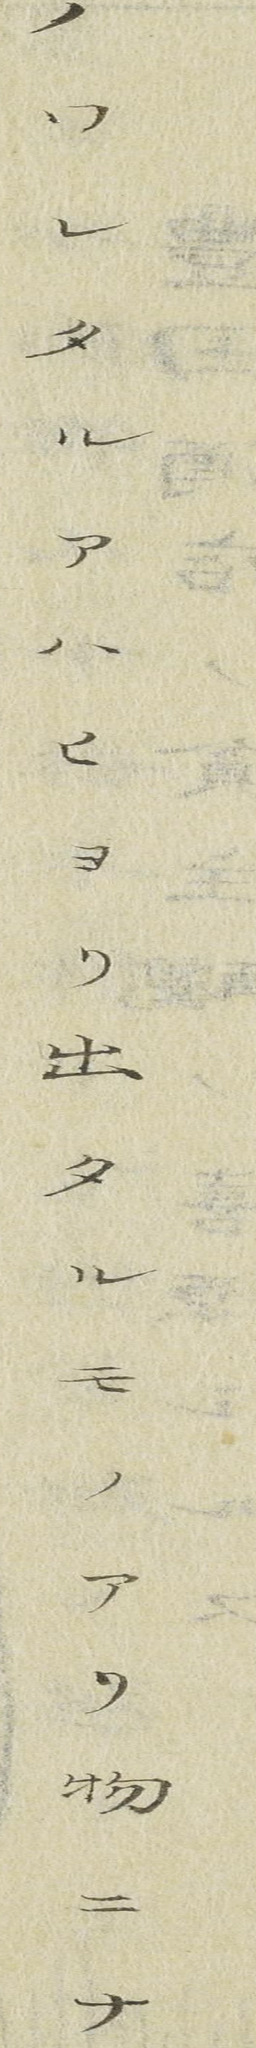ノワレタルアハヒヨリ出タルモノアリ物ニナ
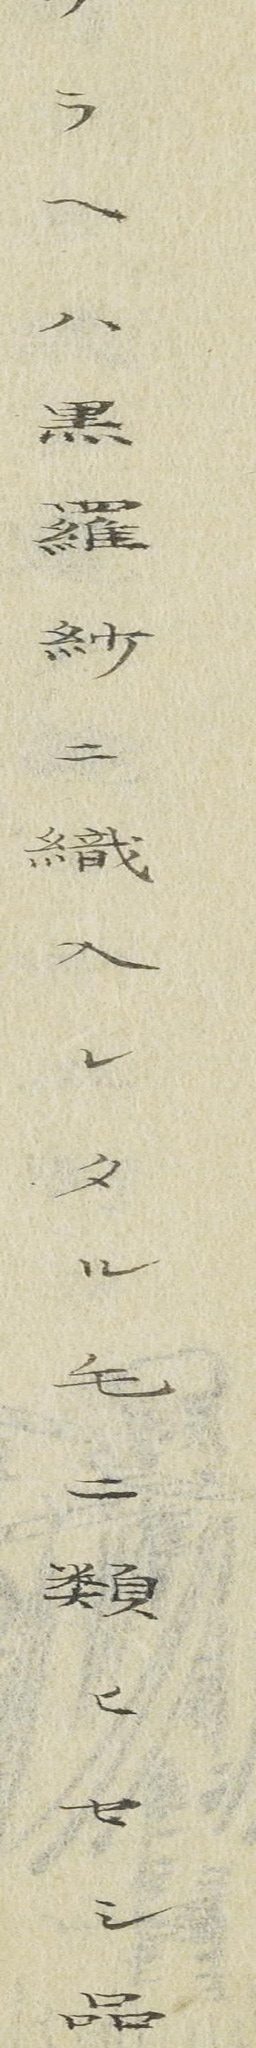ソラヘハ黒羅紗ニ織入レタル毛ニ類ヒセシ品
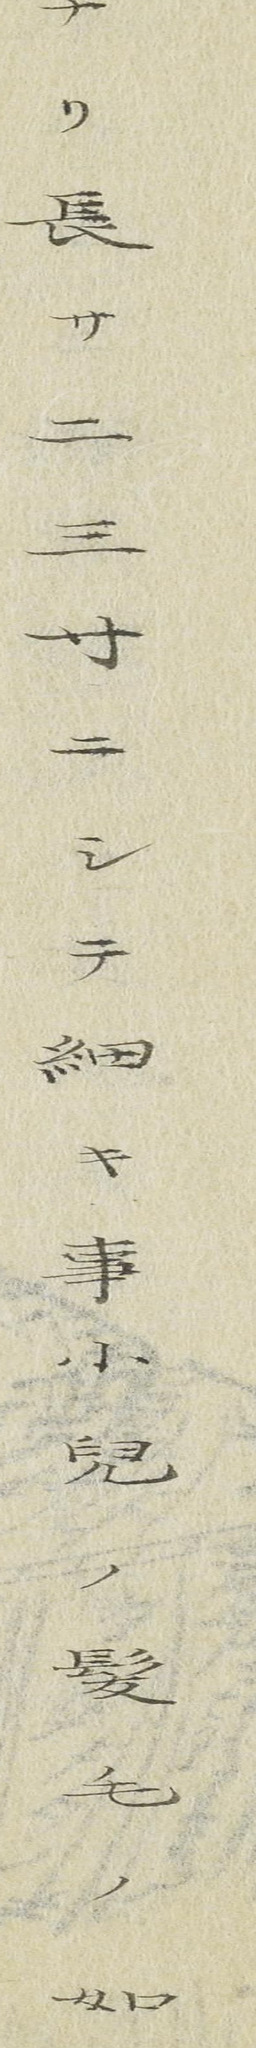ナリ長サ二三寸ニシテ細キ事小児ノ髪毛ノ如
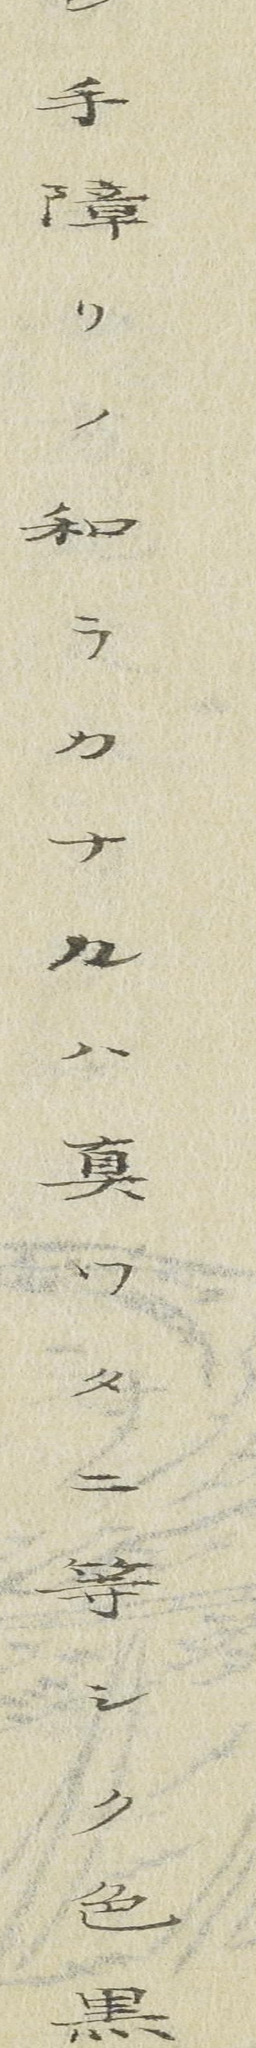シ手障リノ和ラカナルハ真ワタニ等シク色黒
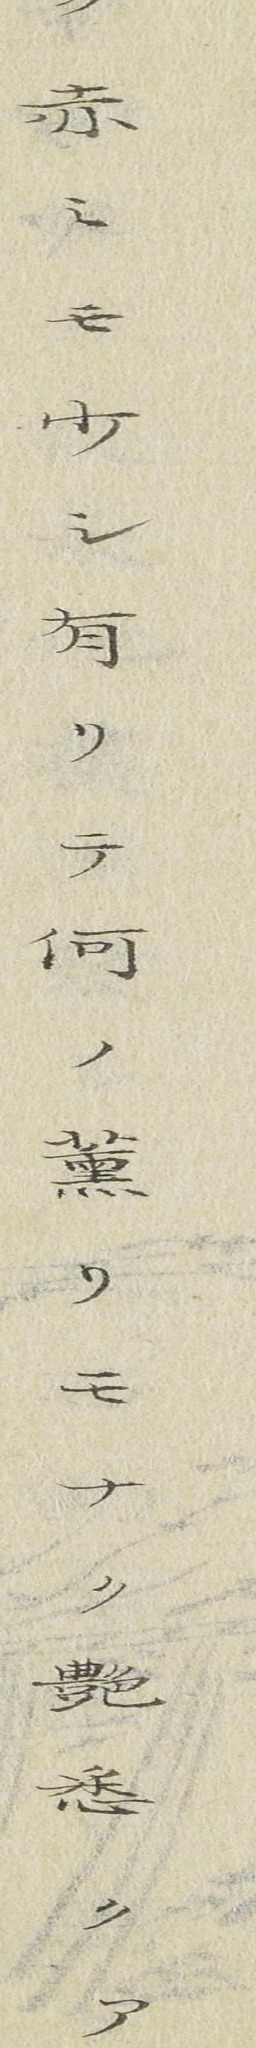ク赤ミモ少シ有リテ何ノ薫リモナク艶悉クア
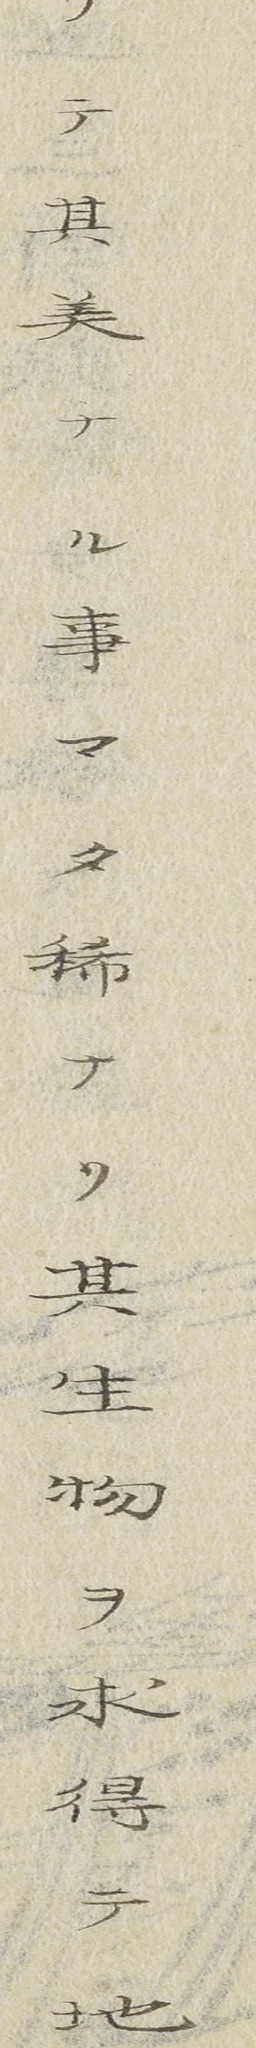リテ其美ナル事マタ稀ナリ其生物ヲ求得テ地
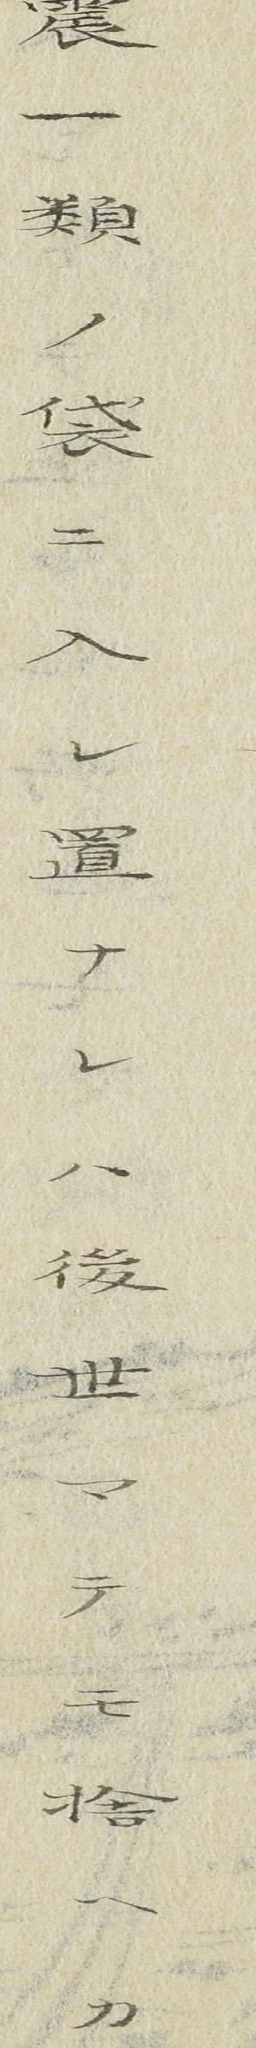震一類ノ袋ニ入レ置ナレハ後世マテモ捨ヘカ
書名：地災撮要　地震之部　巻ノ二
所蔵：東京大学地震研究所図書室 Earthquake Research Institute Library, The University of Tokyo, JAPAN
